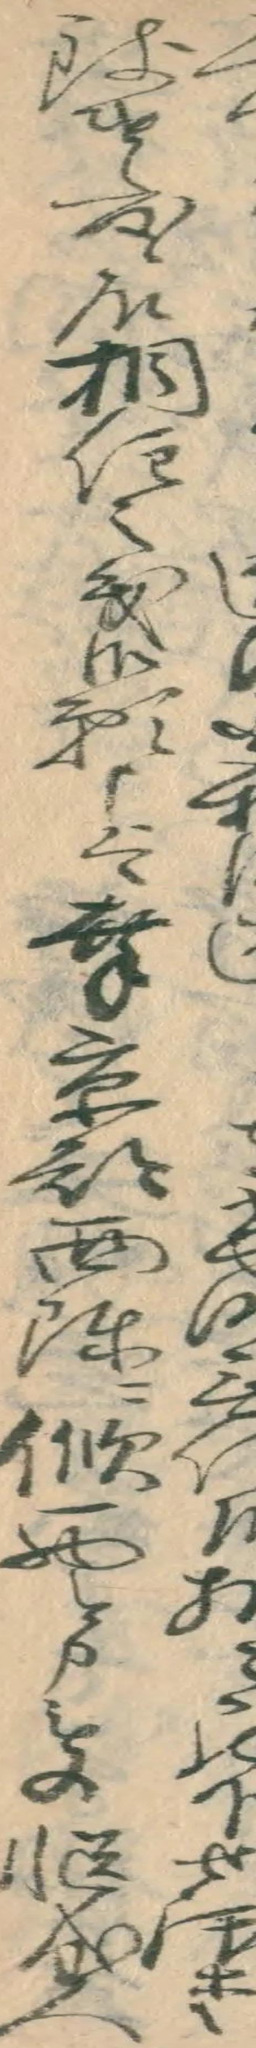致遣候度候故相住之義御願申上候幸京都西陣ニ欣西と申もの慥成人ニ

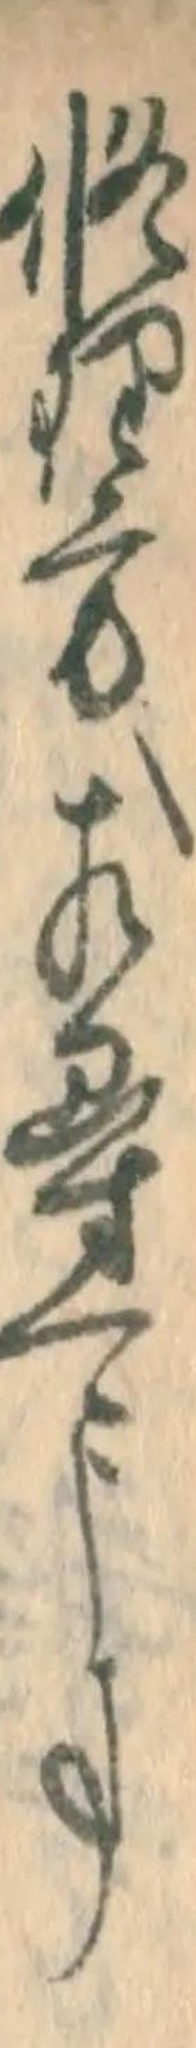修理方へ相尋可申事
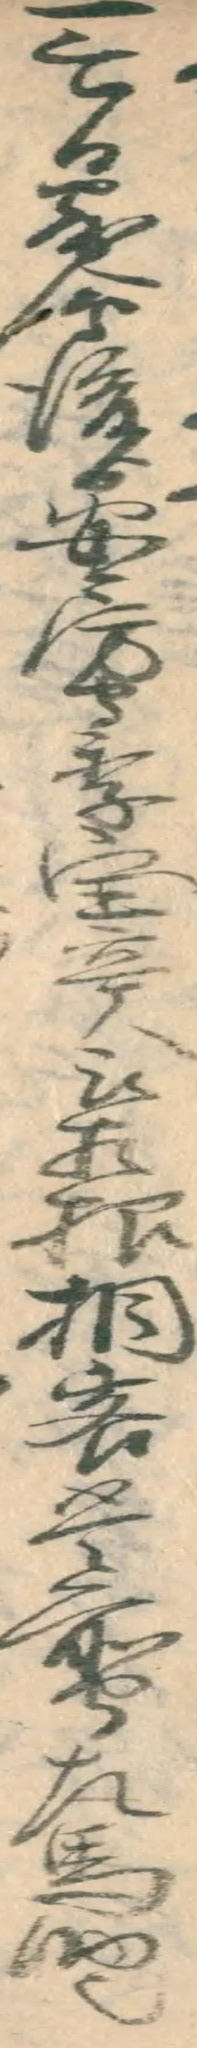一今日寄会後ゟ安房守季宝亭へ被相招相客豊前守左馬助也
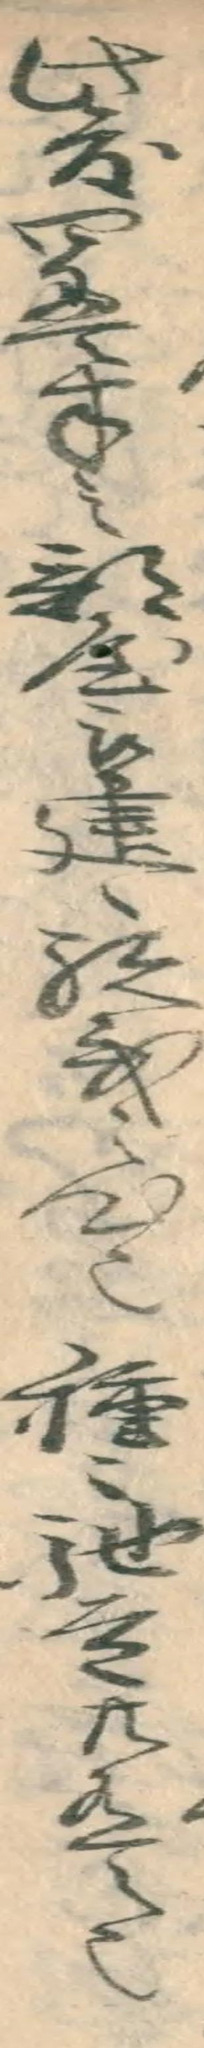此度四畳半之部屋被建候祝義之心也種々馳走共有之也
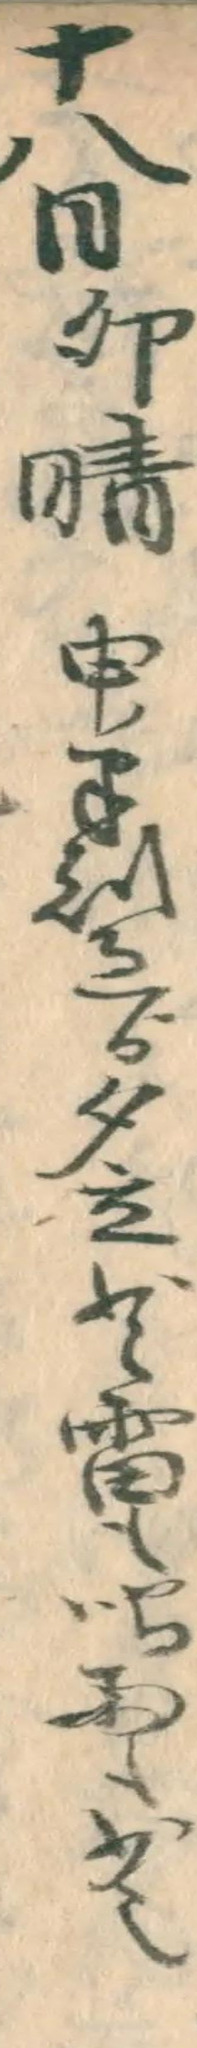十八日卯晴申ノ半刻過ゟ夕立少々雷も鳴雨も少也
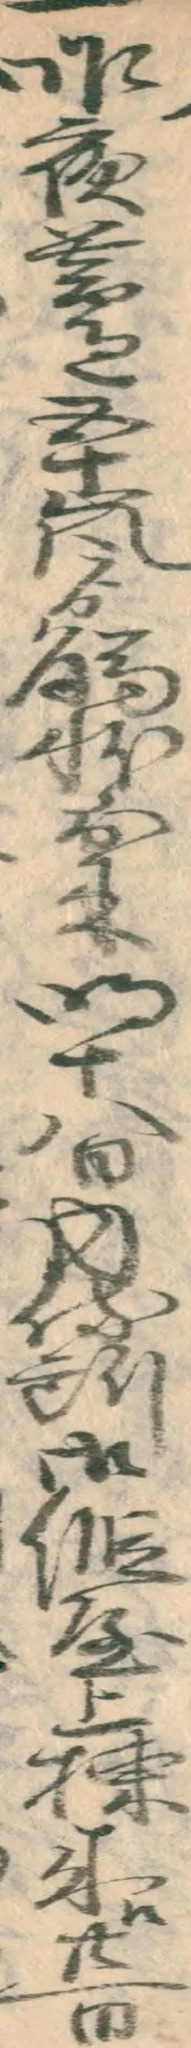一昨夜暮過五十風ゟ触状到来明十八日内侍所御仮屋上棟来ル廿一日
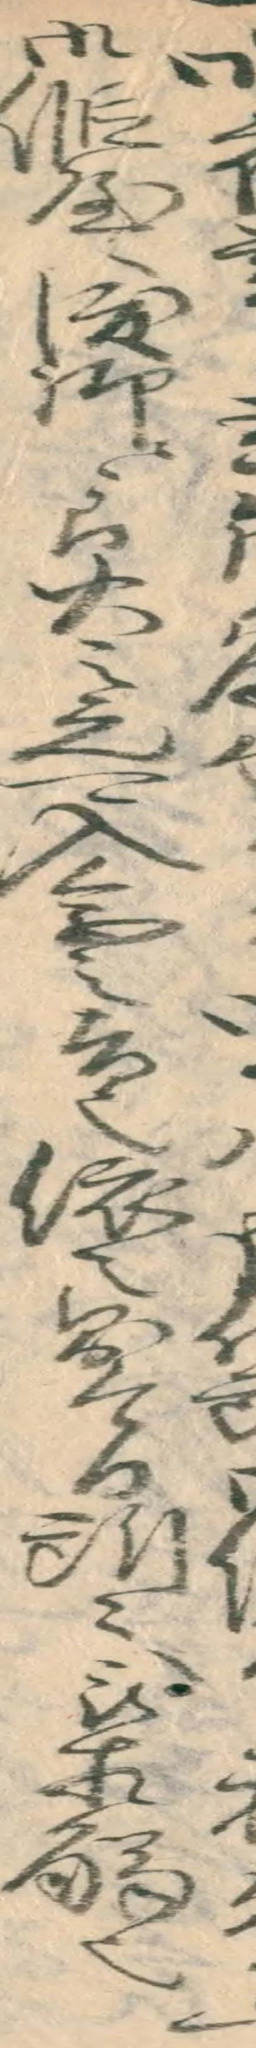御仮屋へ渡御ニ候間火之元可入念之旨也依之則今日所々へ被相触也
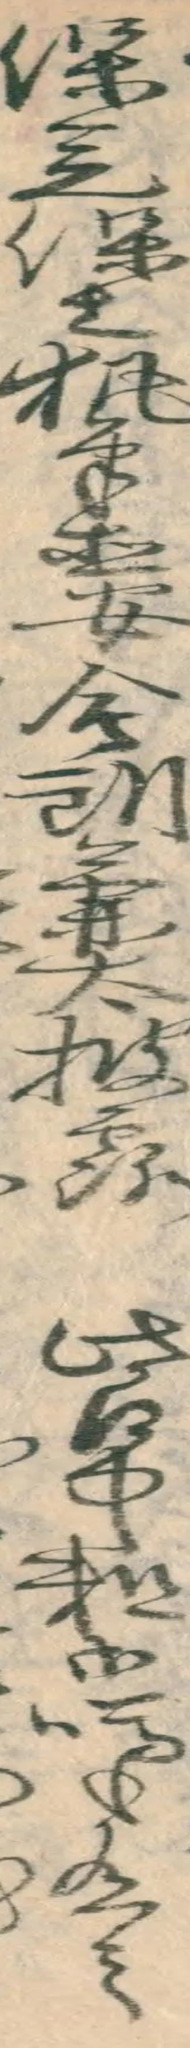保覚保土執筆直安会所兼太披露此間中粗御噂も有之
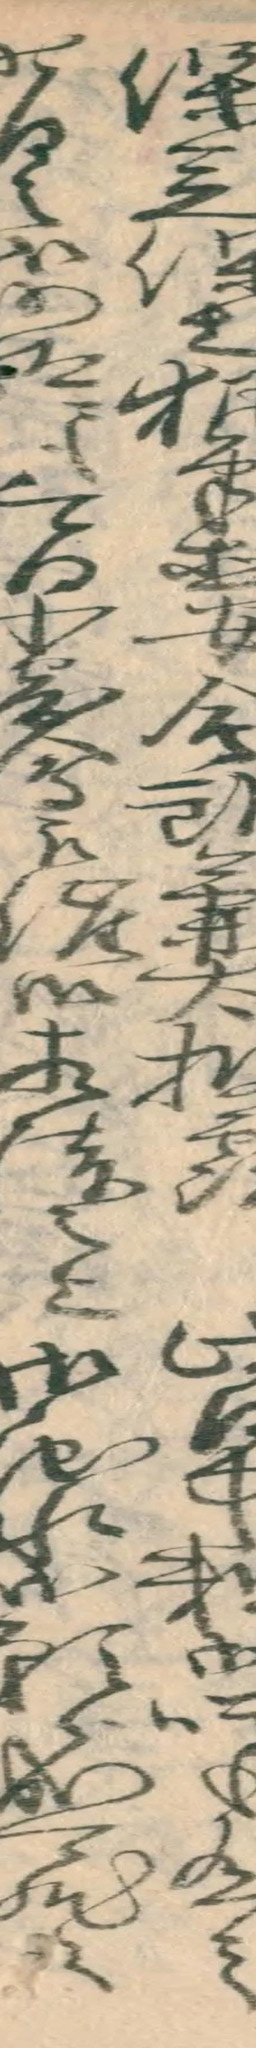昨日之御沙汰ニも今日小寄会被催御相談之上御池水御願被成可然之
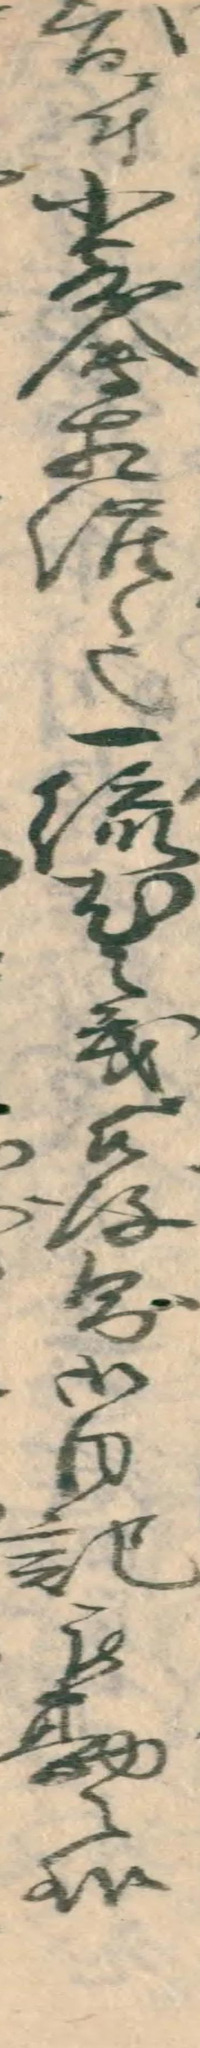旨ニ付小寄会相催候也一統尤之義ニ被存則御日記被勘之処
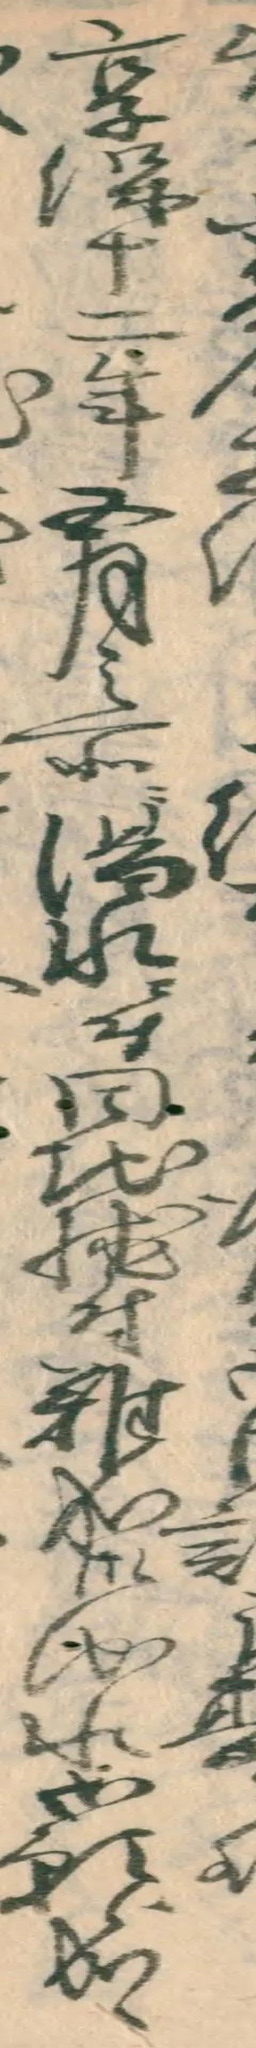享保十二年五月之所ニ渇水ニ付同地植付難成御池水御願被成候
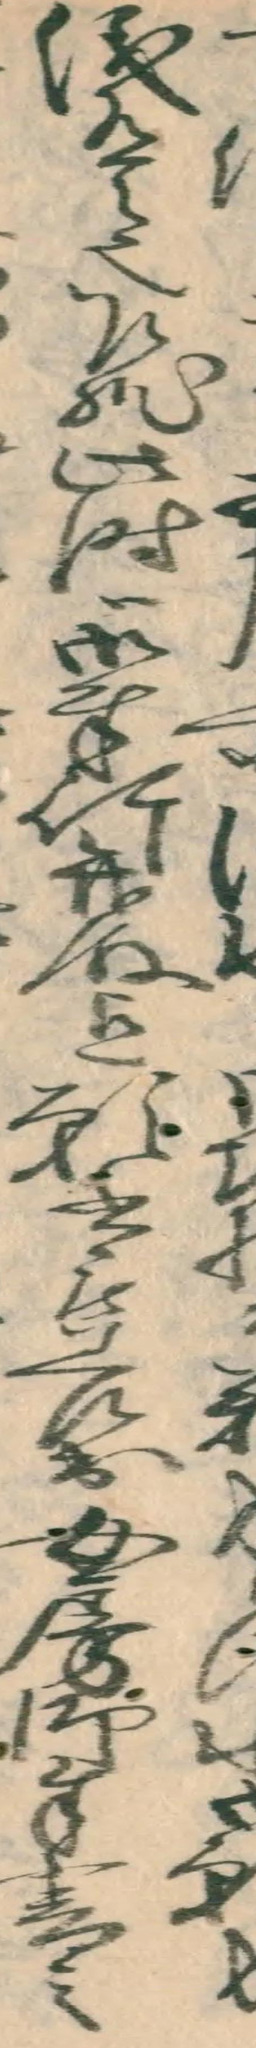儀有之也乍然此時ハ御奉行弁殿迄願書被差出女房御奉書之
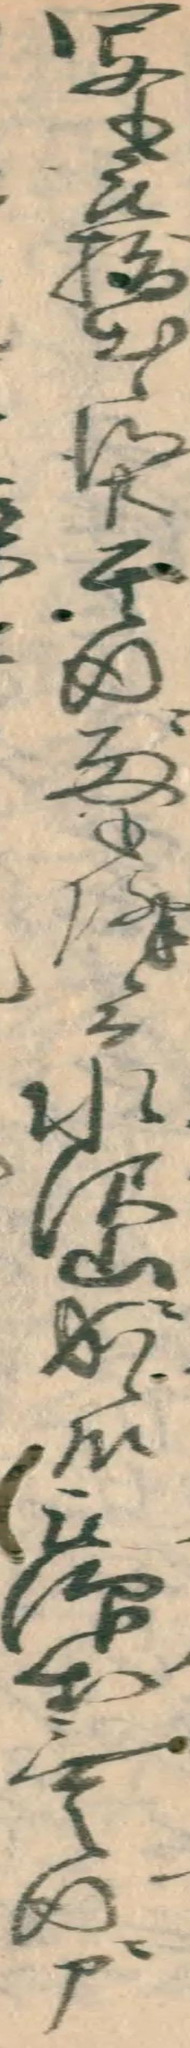写も被指出候得共其内ニ雨も降候而水沢山ニ成候故被仰出無之内ニ申
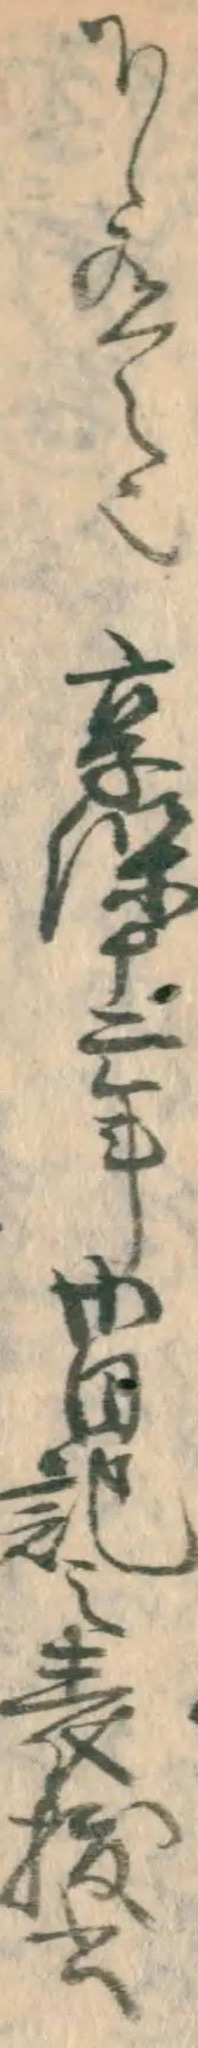下候有之也享保十二年御日記之表抜書
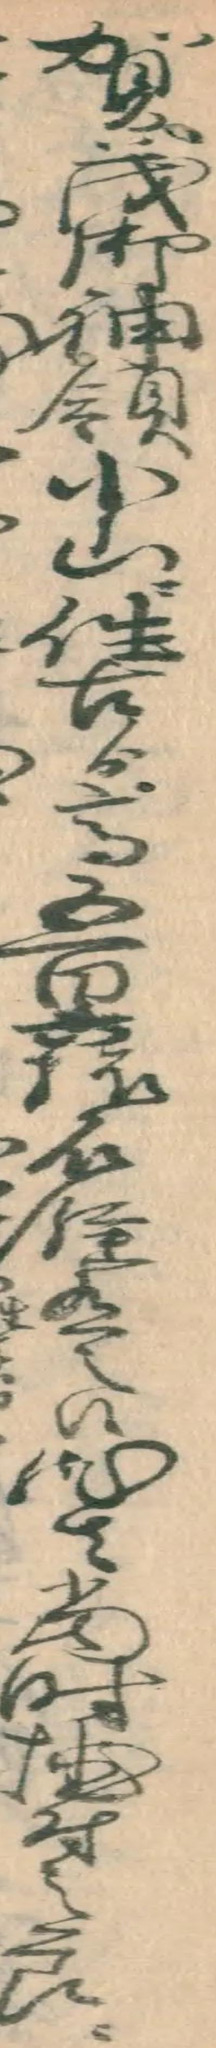賀茂御神領小山ニ往古ゟ高五百六拾石余有之候然者当時植付之節ニ
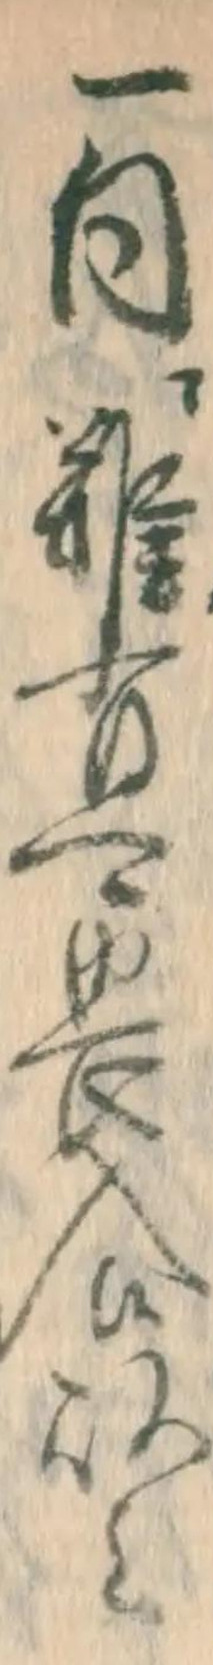一同ニ難有可畏入候以上
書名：賀茂社記録. 第58冊
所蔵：国立国会図書館 National Diet Library, JAPAN
